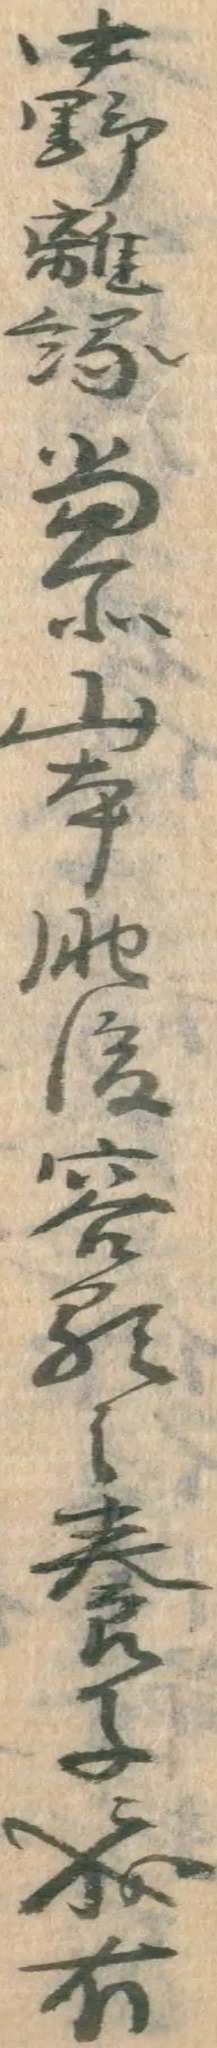中野離縁、當所山本肥後容顕之養子ニ成、有
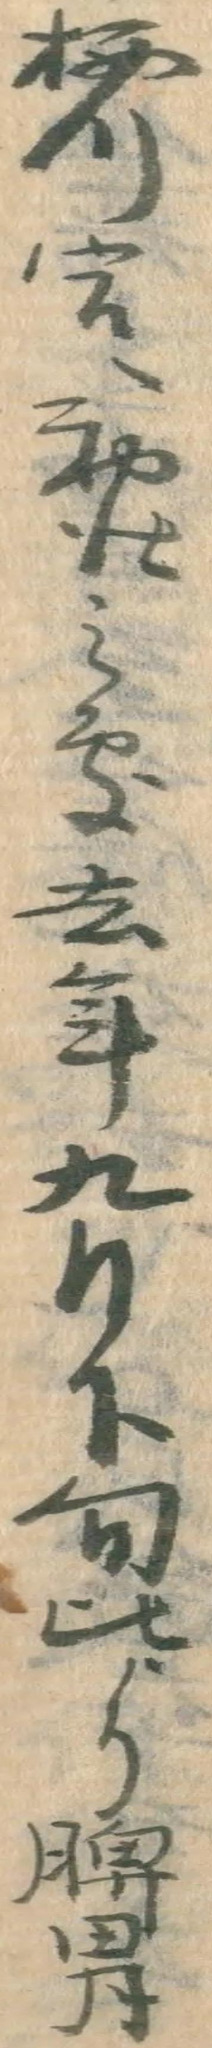栖川宮へ勤仕之處、去年九月下旬比より脾胃

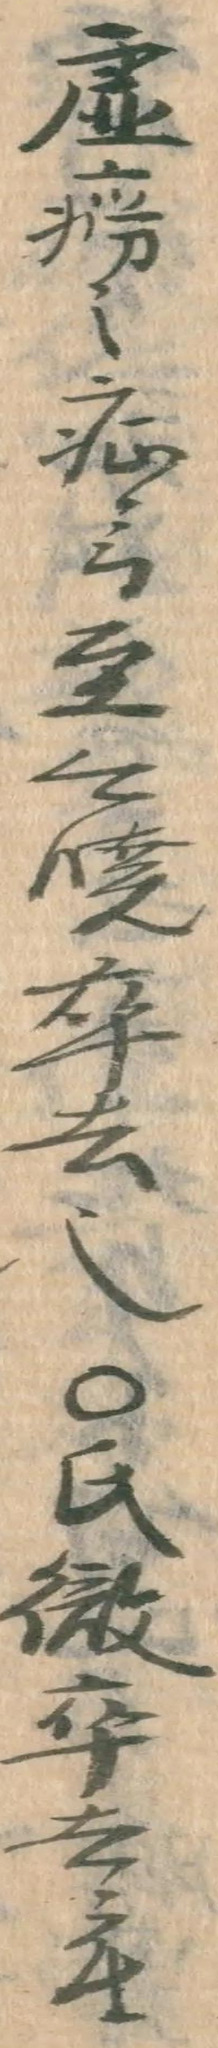虚症之病ニ而、至今暁卒去也、○氏徹卒去ニ付
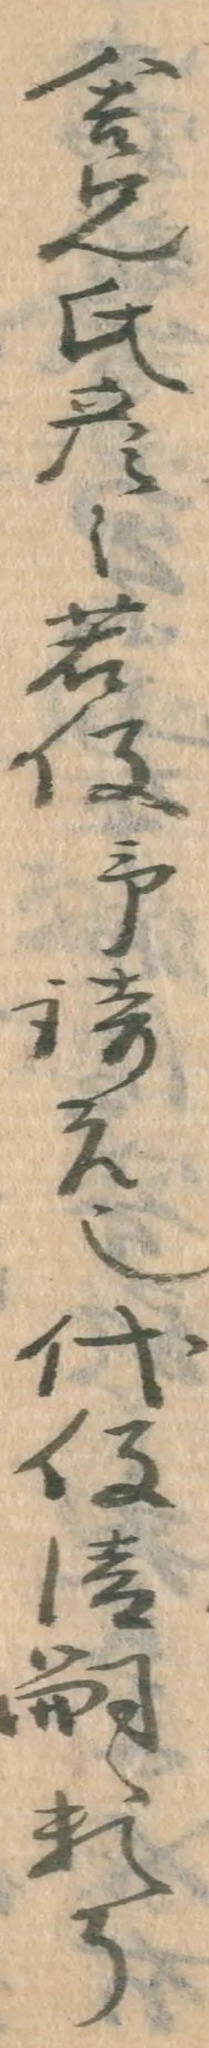舎兄氏彦之苦役、予請取也、代役清嗣へ頼了、
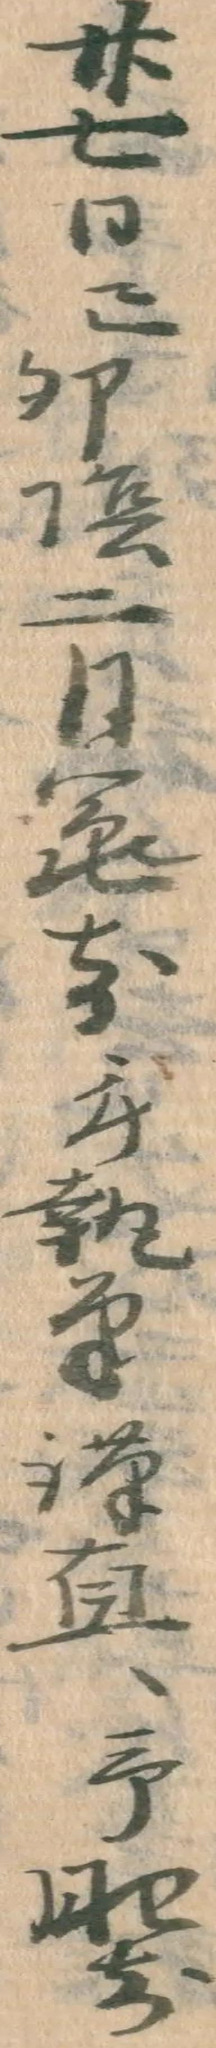廿七日已申陰、二月鬮前ニ付、執筆譜直へ予肥前
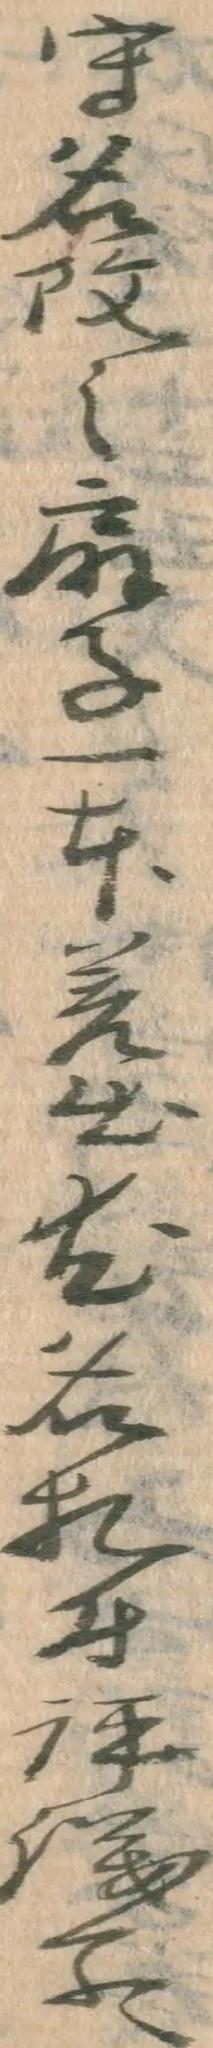守名改之扇子一本差出、尤名札付評議所へ
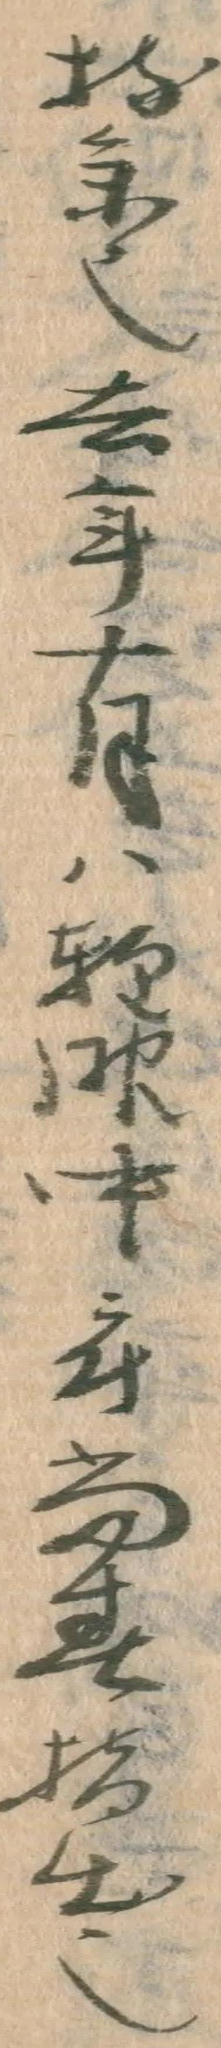持参也、去年十月ハ軽服中ニ付、當春指出也、
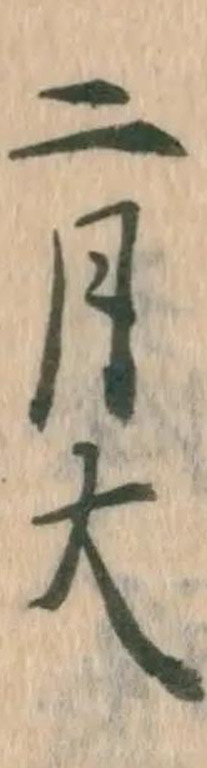二月大
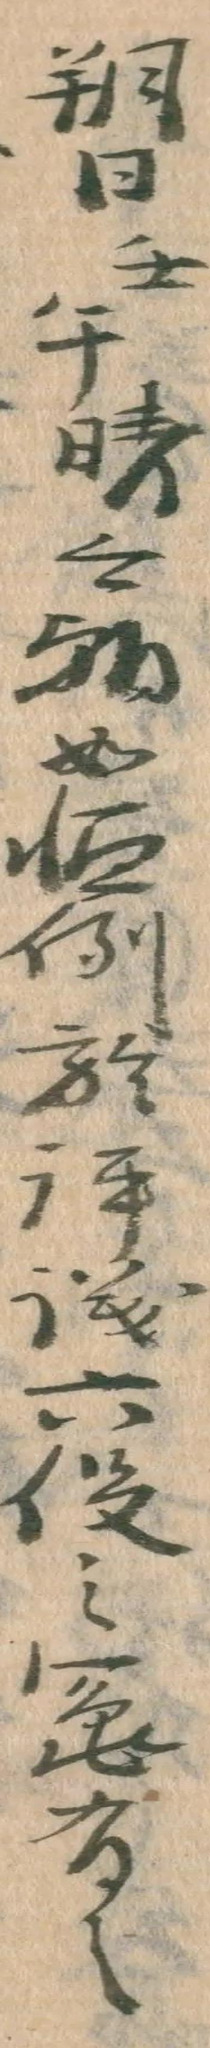朔日壬午晴、今朝如恒例於評議六役之鬮有之、
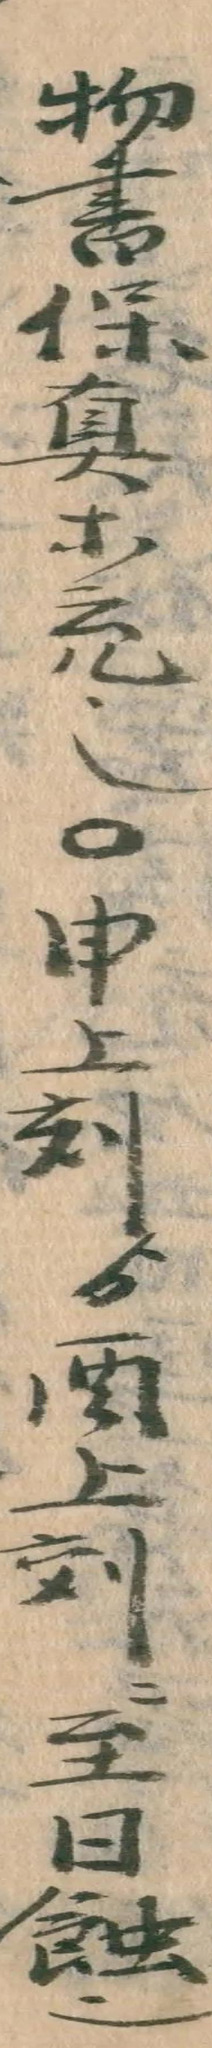物書保真等充也、○申上刻ゟ酉上刻ニ至、日蝕也、
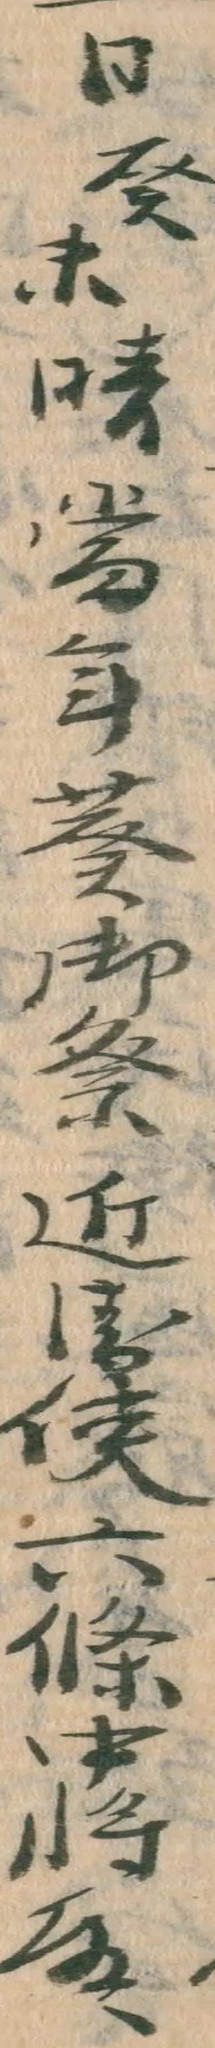二日癸未晴、當年葵御祭近衛使六條中将殿
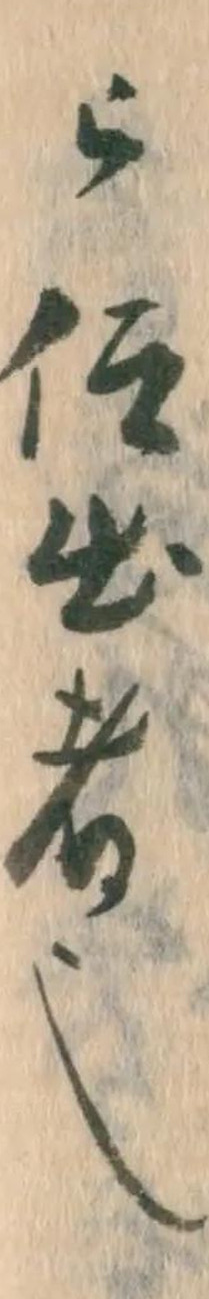被仰出者也
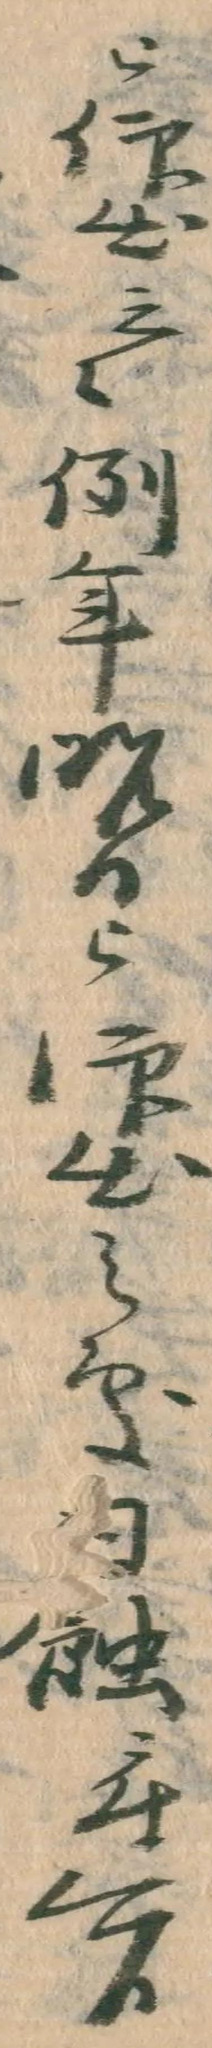被仰出云々、例年朔日被御出之處、日蝕ニ付今日
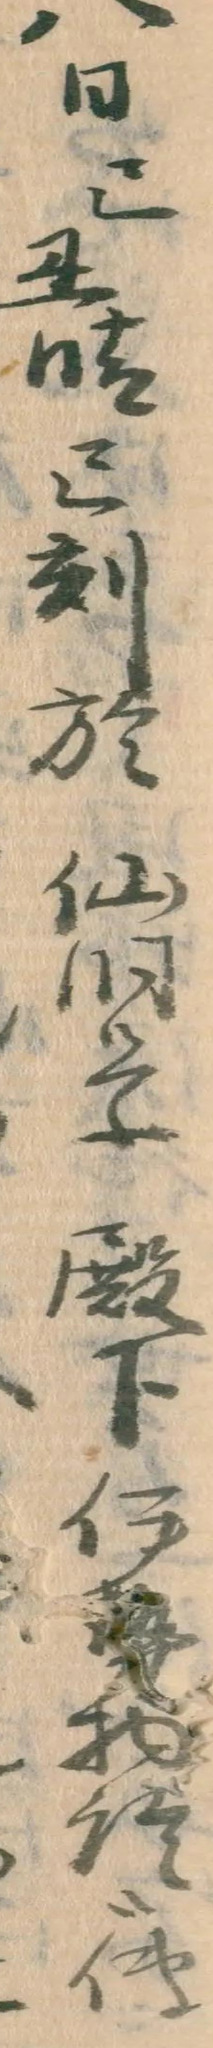八日己丑晴、巳刻於仙洞御所殿下伊勢物語御傳
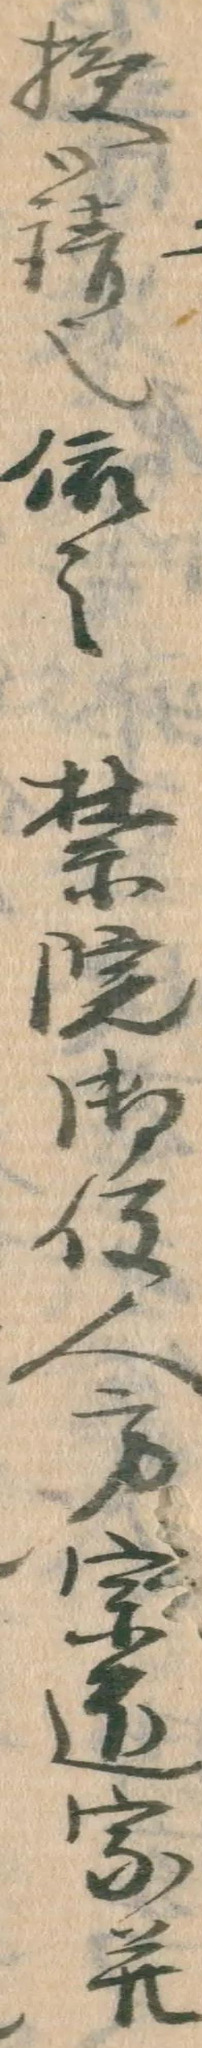授御請也、依之禁院御役人方宗匠宗并
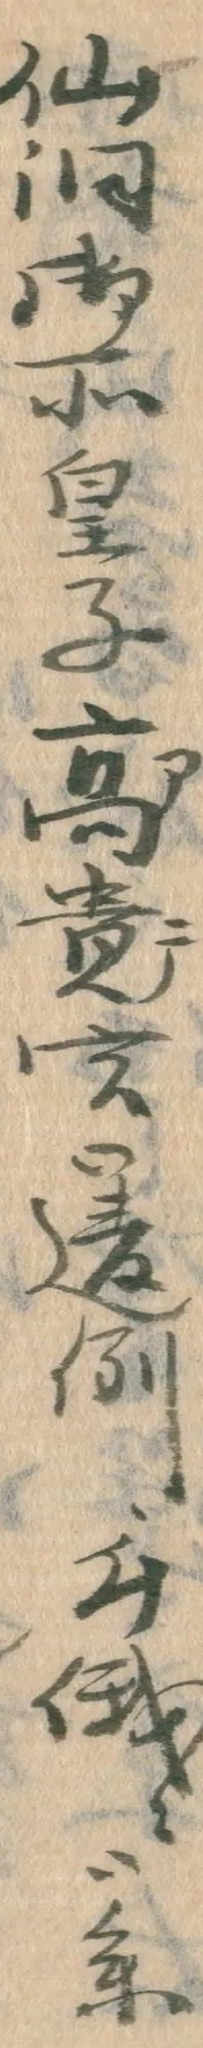仙洞御所皇子高貴宮御違例ニ付、俄ニ御参
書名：賀茂社記録. 第63冊
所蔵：国立国会図書館 National Diet Library, JAPAN
